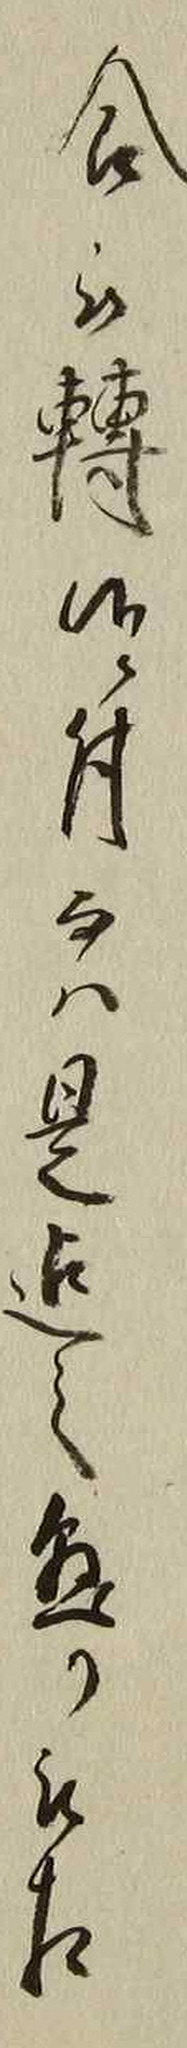合被転候に付而は是迄の懸り被相
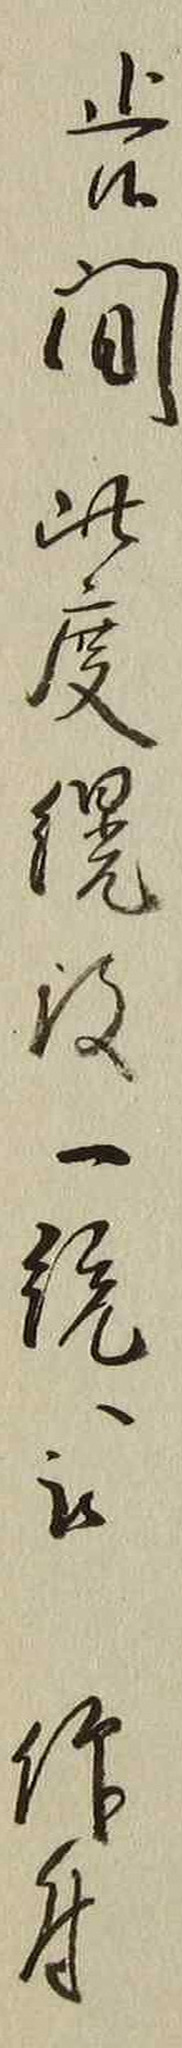止候間此度縨役一統へ被仰付
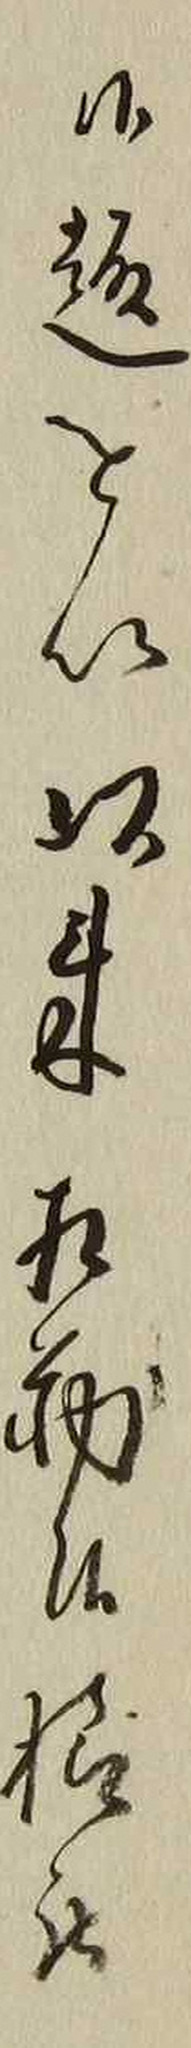候趣を以以来相勤候様被
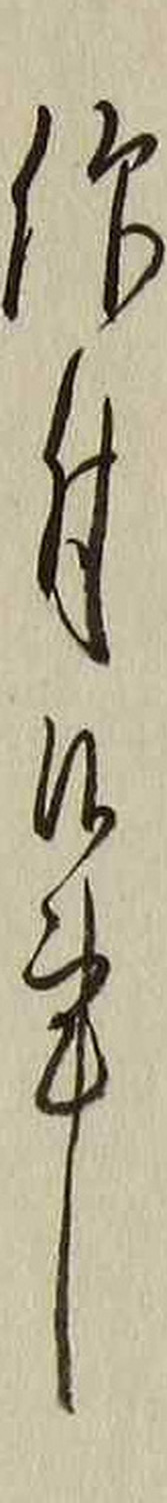仰付候事
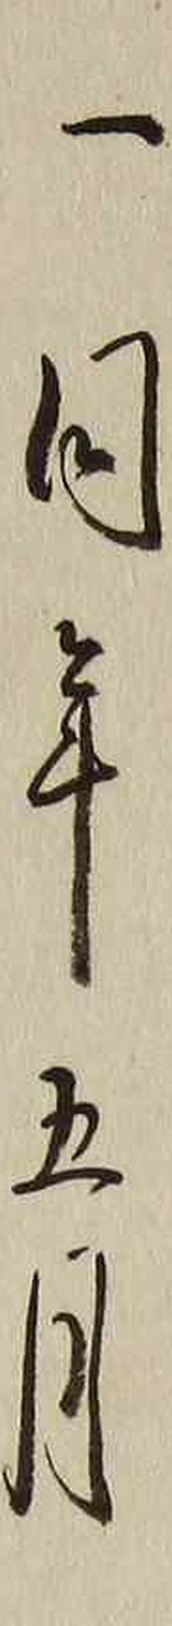一同年五月
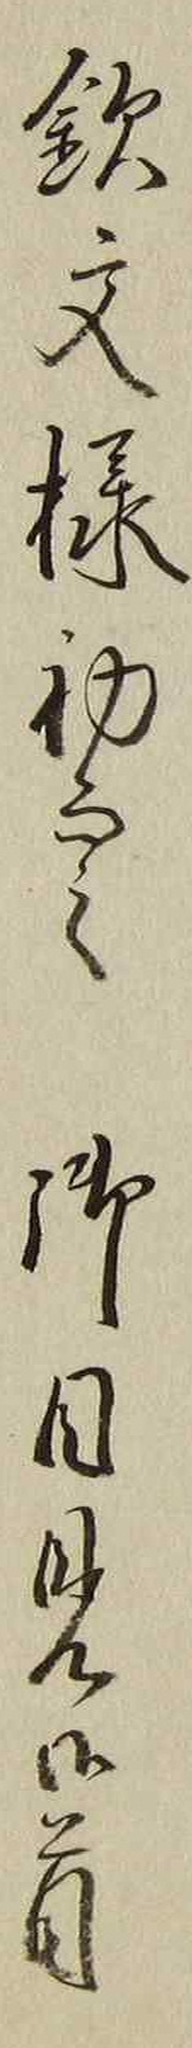欽文様初而の御目見御首
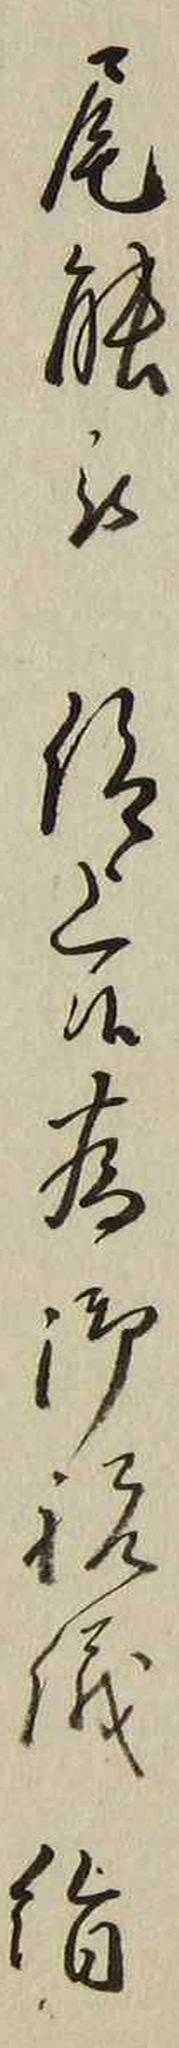尾能被仰上候為御祝儀絹
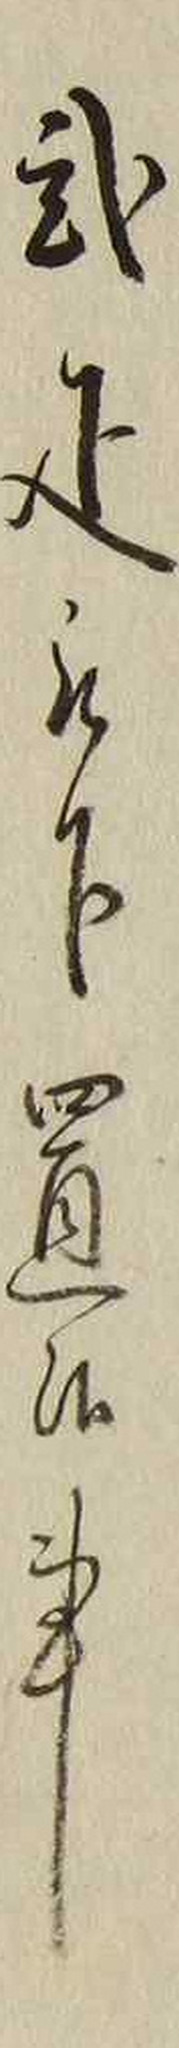弐疋被下置候事

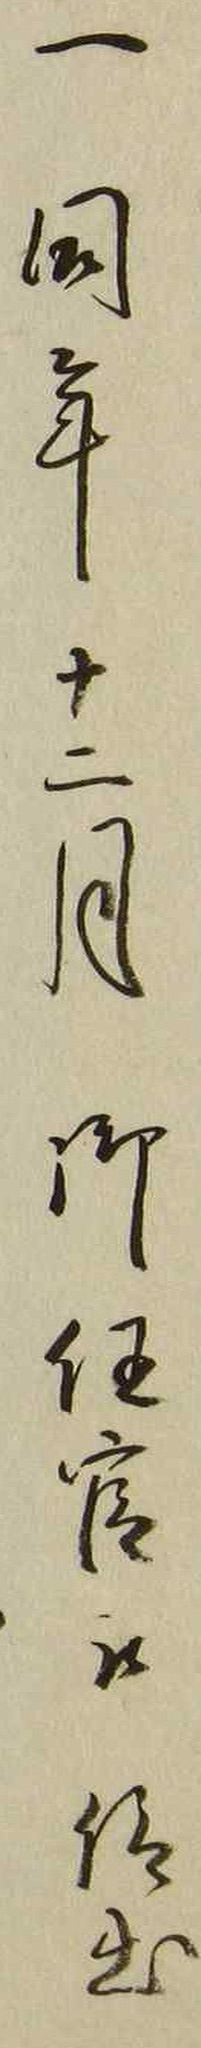一同年十二月御任官被仰出
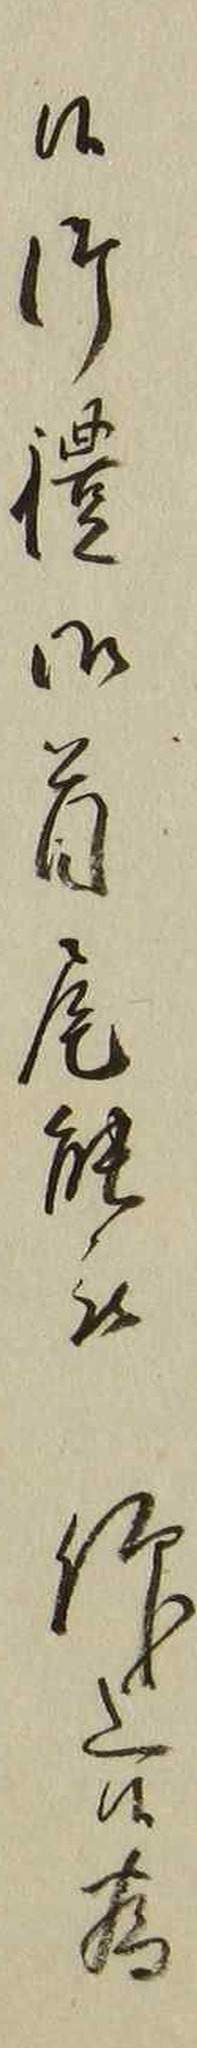候御礼御首尾能被仰上候為
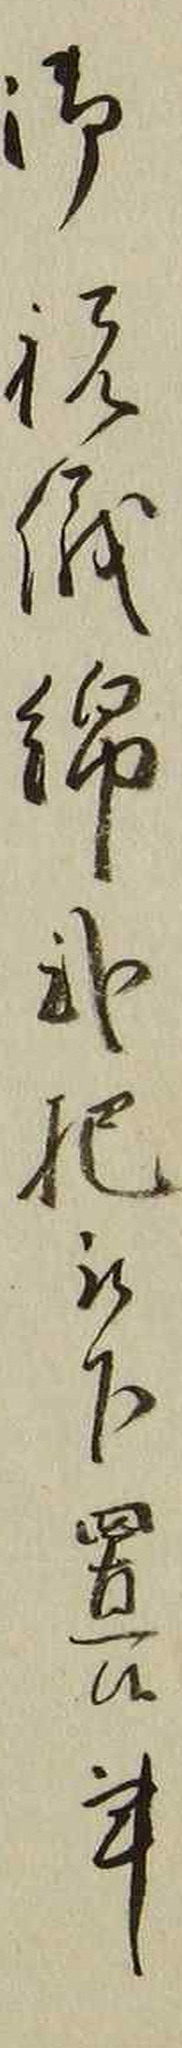御祝儀綿弐把被下置候事
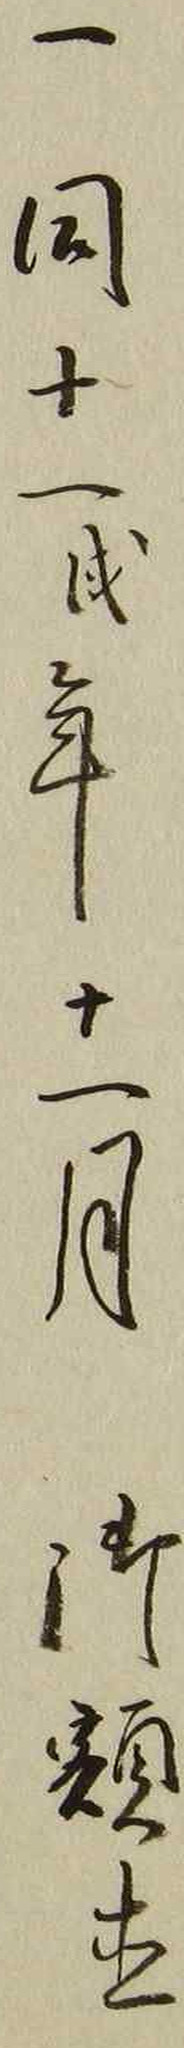一同十一戌年十一月御額直
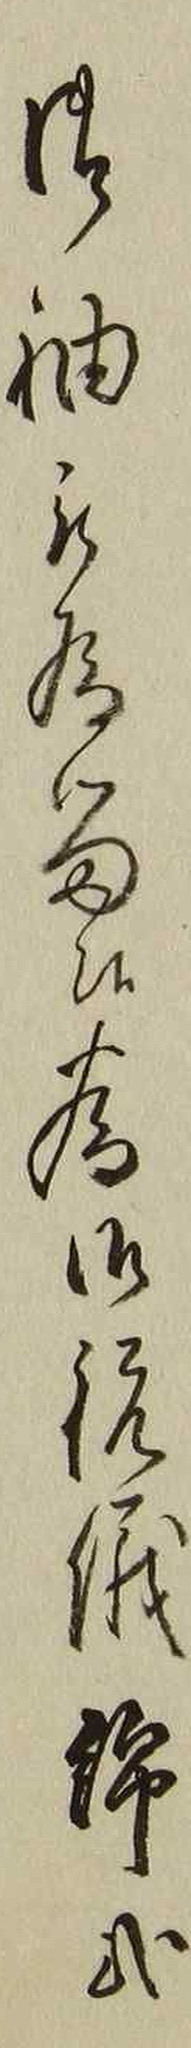御袖被為留候為御祝儀綿弐
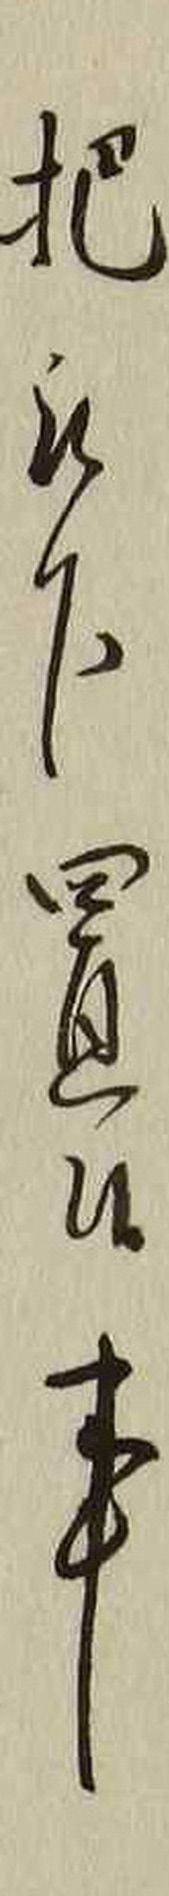把被下置候事
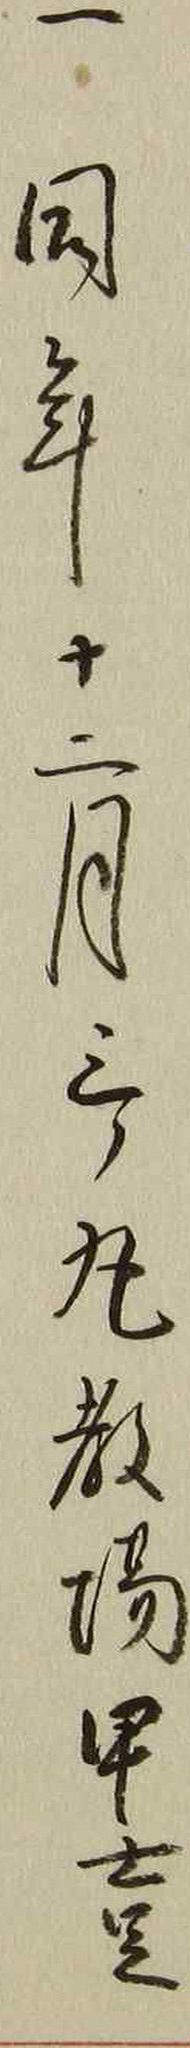一同年十二月三ノ丸教場甲士足
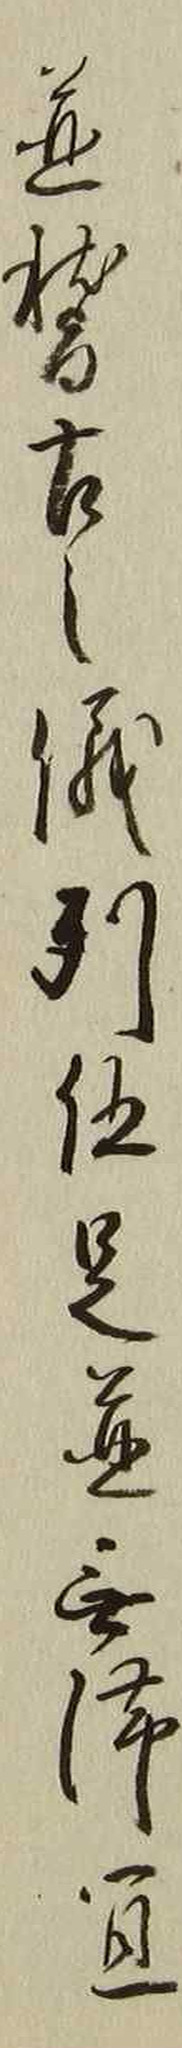並稽古の儀列伍足並無滞宜
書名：諸士系譜　巻之1　い之部1
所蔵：会津若松市立会津図書館
